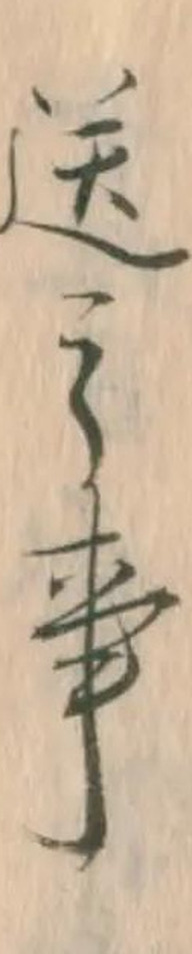送之事
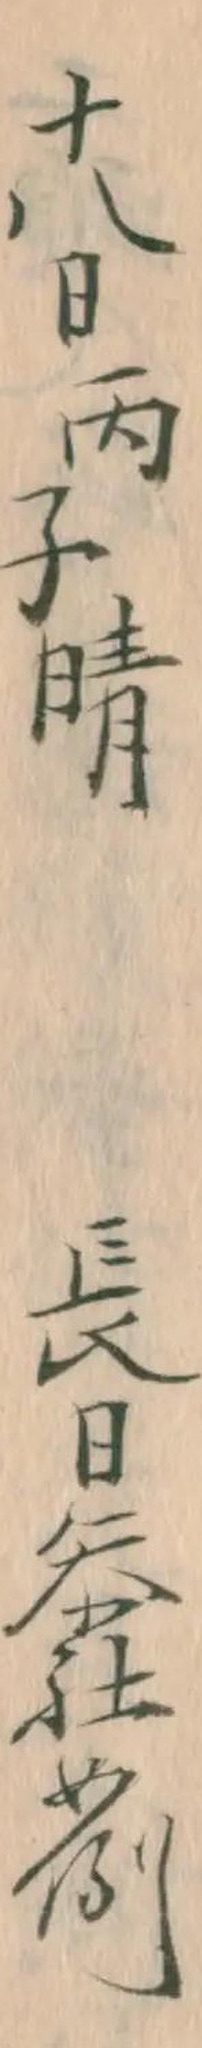十八日丙子晴長日参社如例
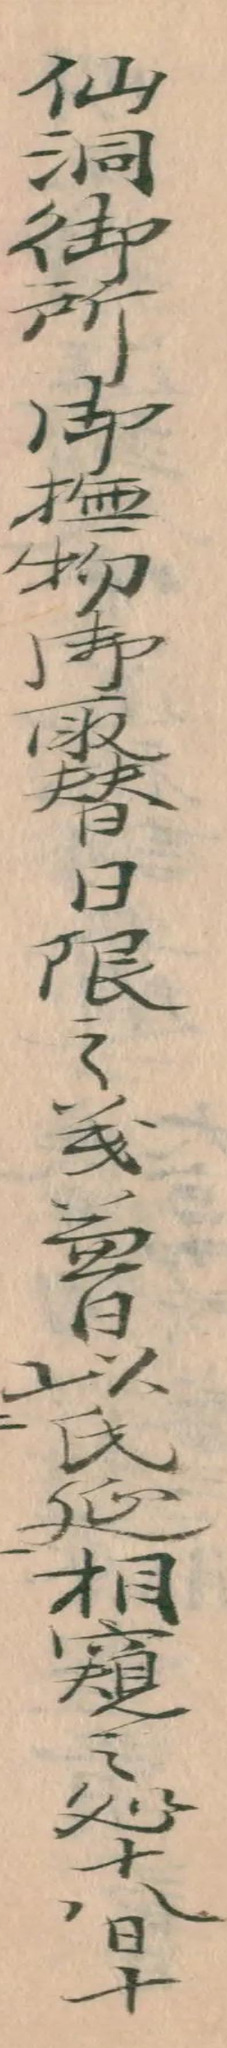一仙洞御所御撫物御取替日限之義兼日以氏延相窺之処十八日十
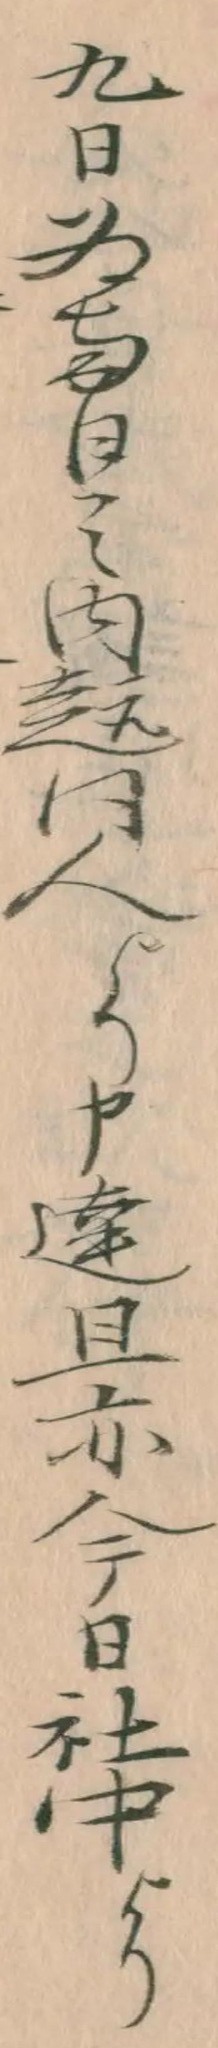九日為両日之内趣同人より申達且亦今日社中より
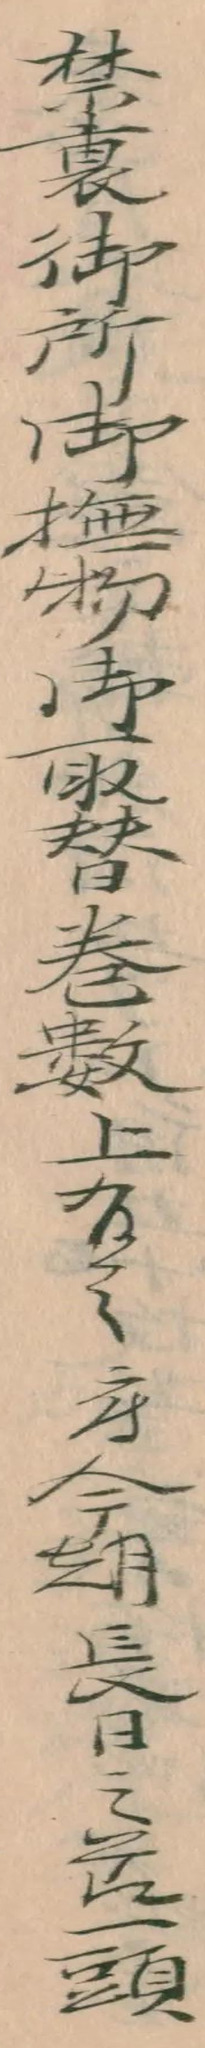禁裏御所御撫物御取替巻数上有之ニ付今朝長日之節一頭
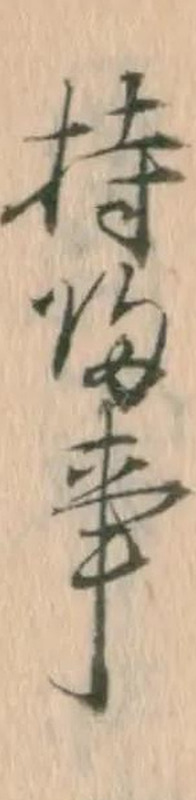持帰事
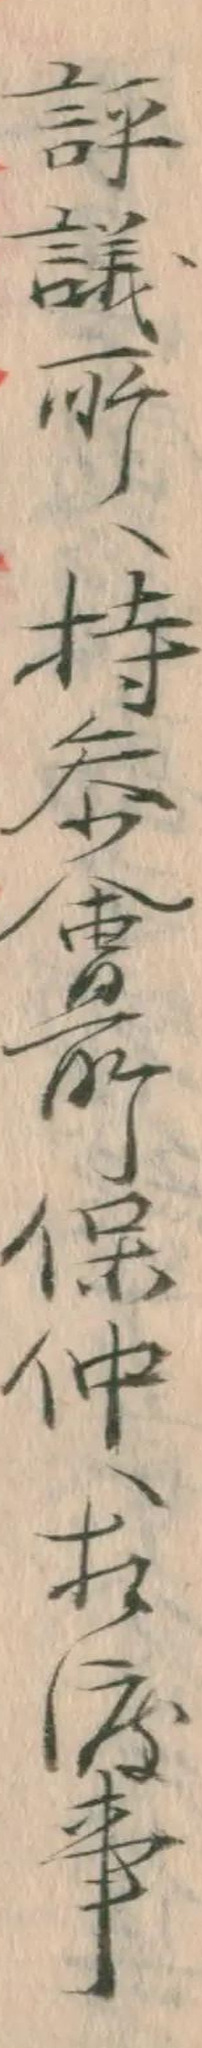評議所へ持参會所保仲へ相渡事
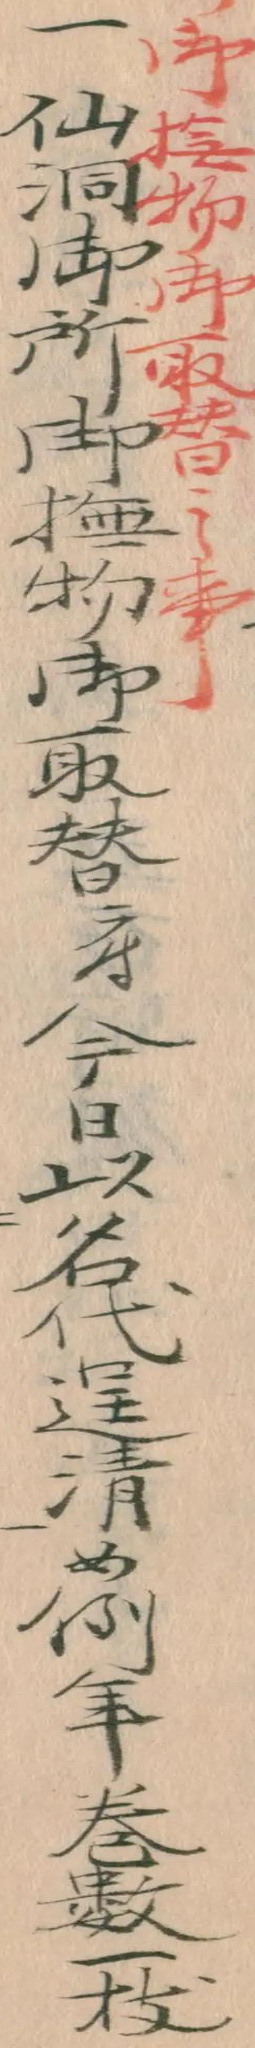一仙洞御所御撫物御取替ニ付今日以名代逞清如例年巻数一枚
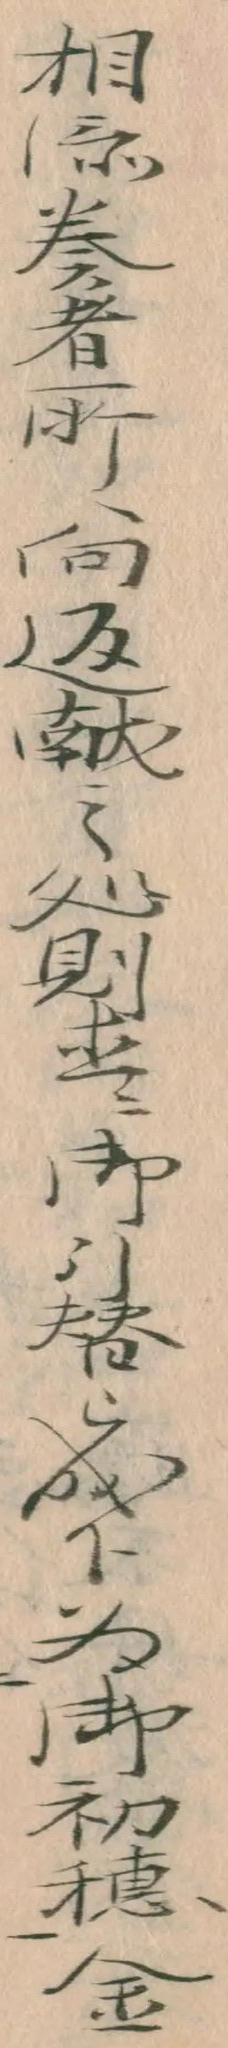相添奏者所へ向返献之処則直ニ御引替被成下為御初穂金
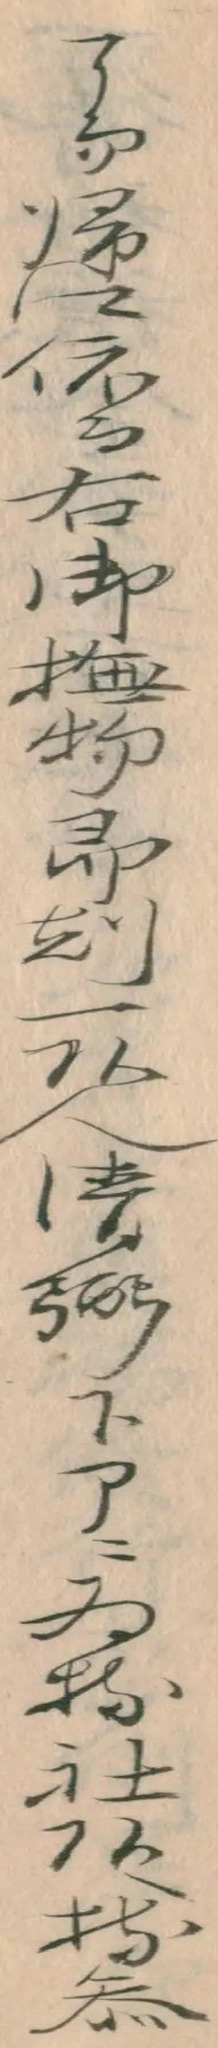了而帰郷依而右御撫物即刻一頭人清弼下部ニ為持社頭へ持参
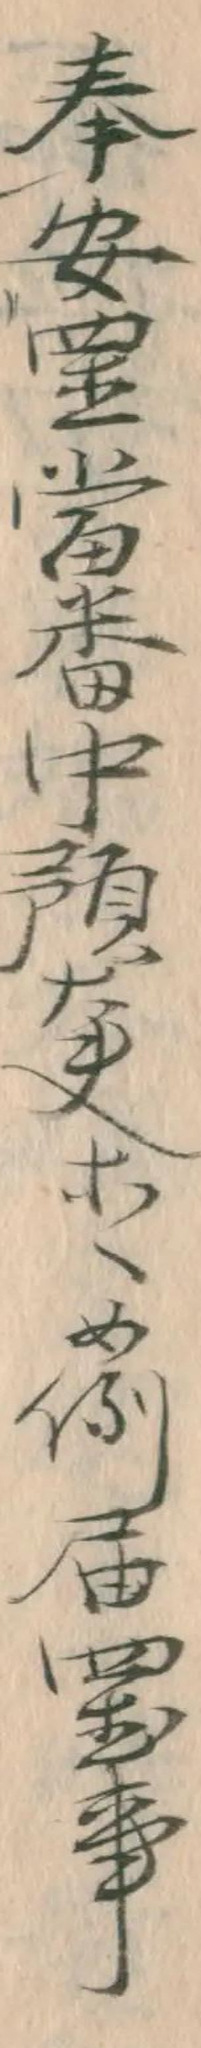奉安置當番中預大夫等へ如例届置事
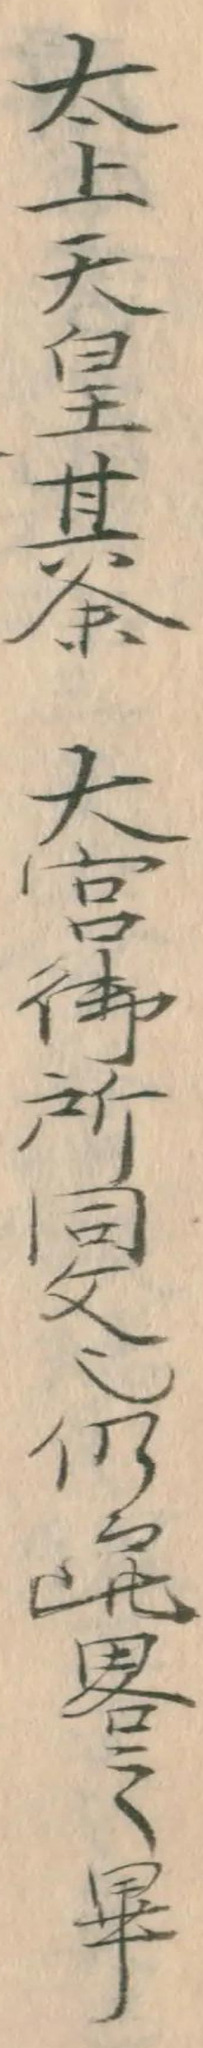太上天皇其余大宮御所同文也仍而此畧之畢

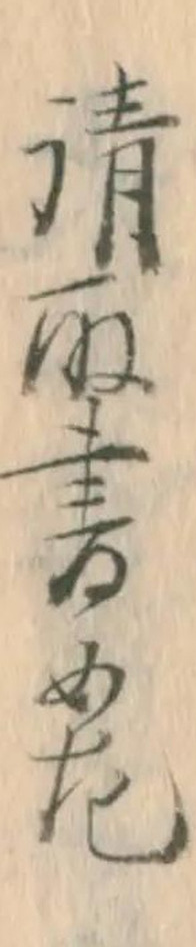請取書如左
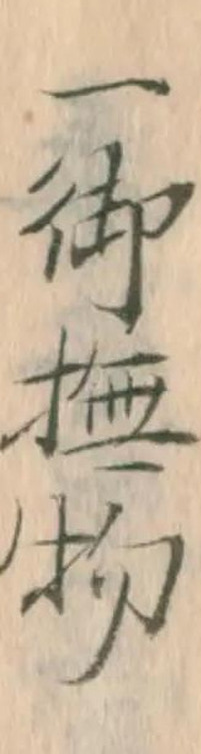一御撫物
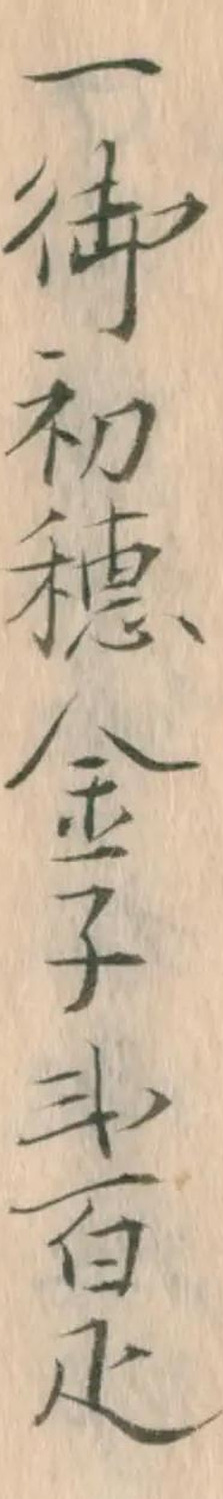一御初穂金子弐百疋
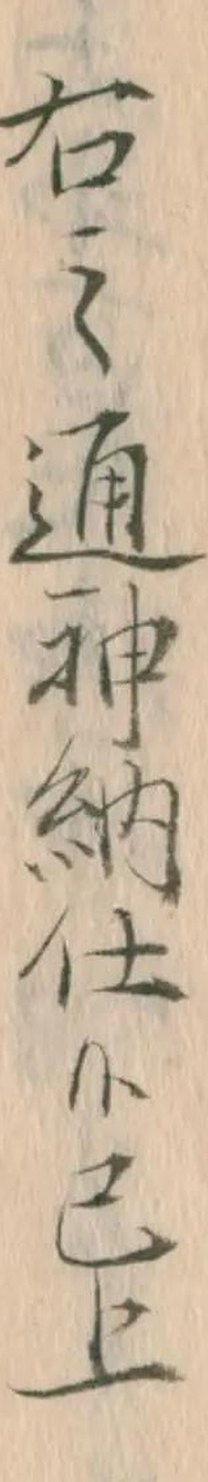右之通神納仕候已上
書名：賀茂社記録. 第74冊
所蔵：国立国会図書館 National Diet Library, JAPAN
